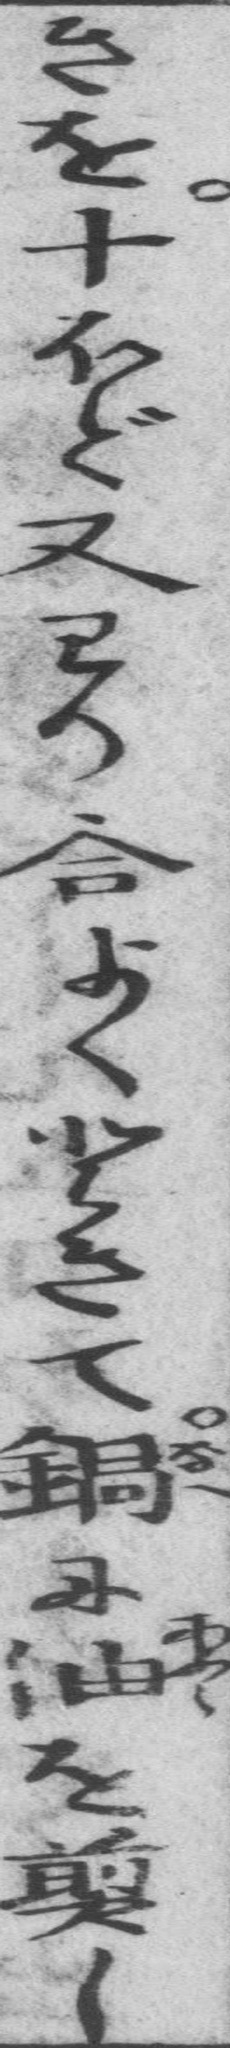きを。十ほど又わり合よくときて。鍋に油を煎し
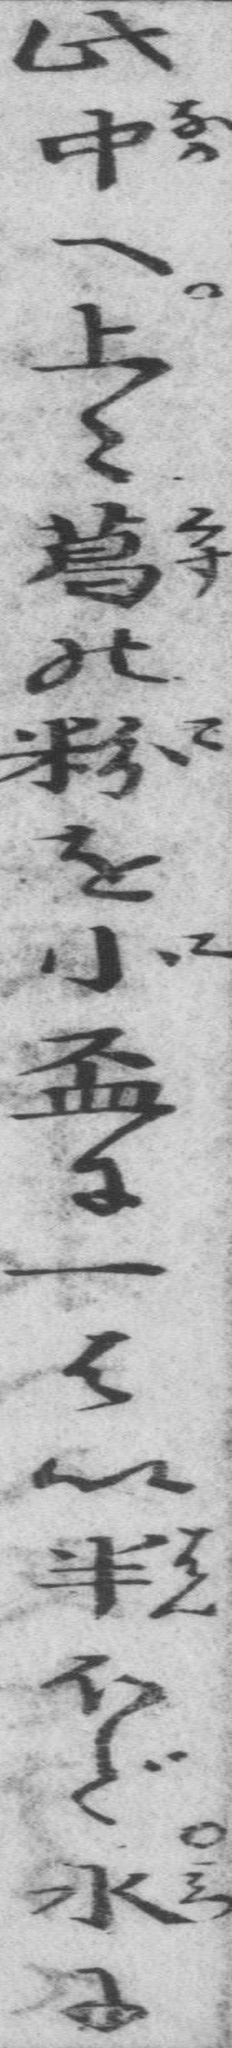此中へ。上々葛の粉を小盃に一はい半ほど。水に
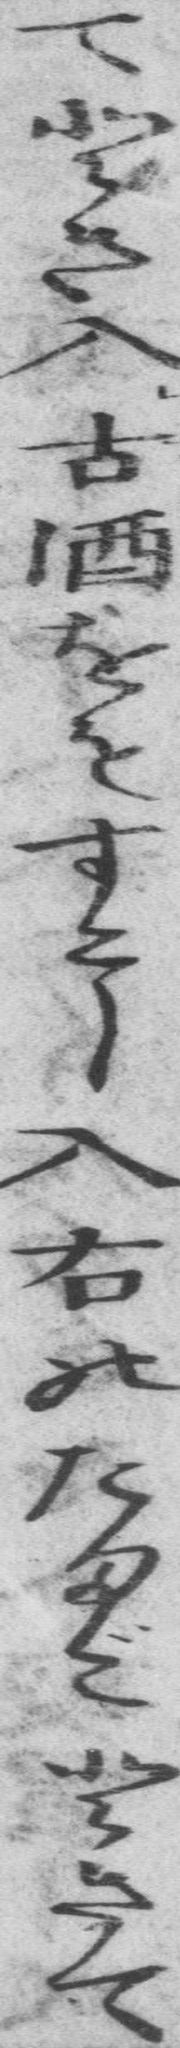てとき入れ。古酒をもすこし入右のたまご。ときて
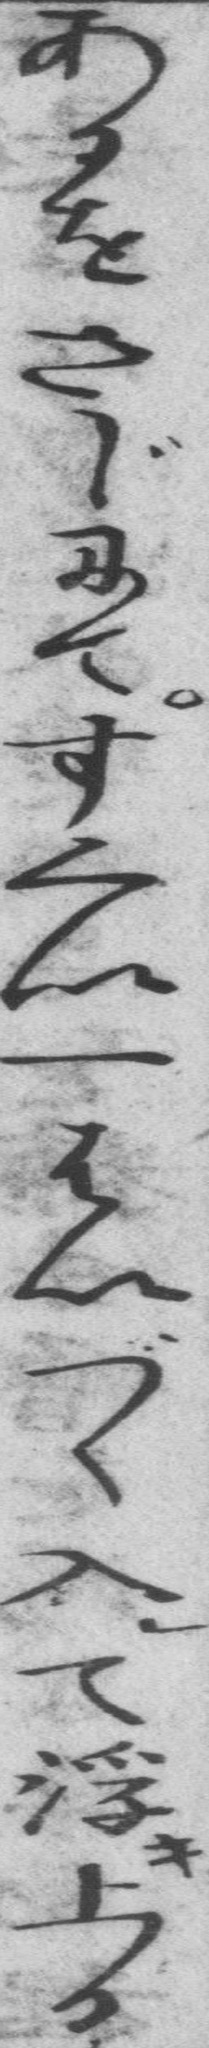あわをさじにて。すくい一はいづゝ入れて浮き上る
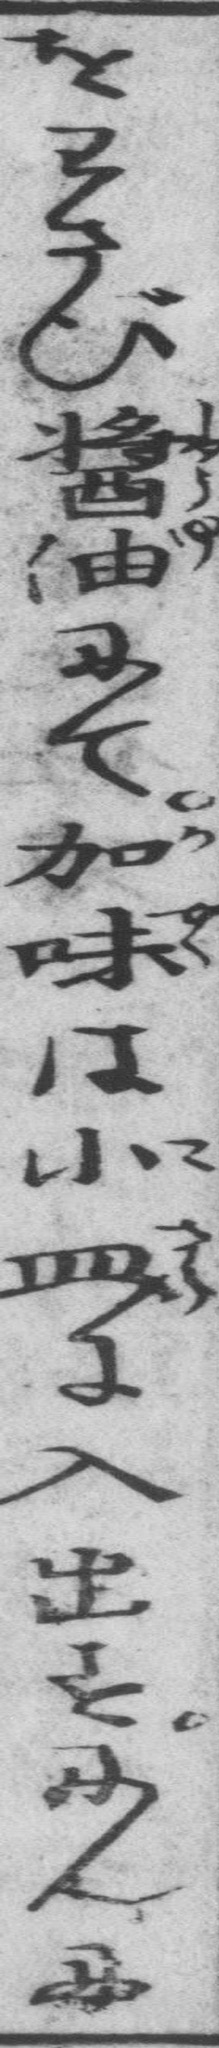をわさび醤油にて。加味は小皿に入出す。にんに
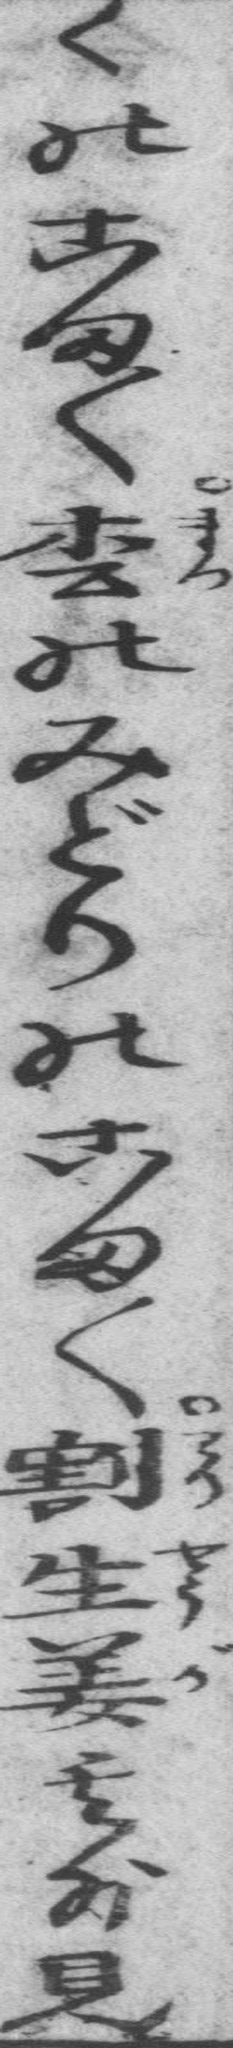くのこま〳〵。松のみどりのこま〳〵。割生姜其外見

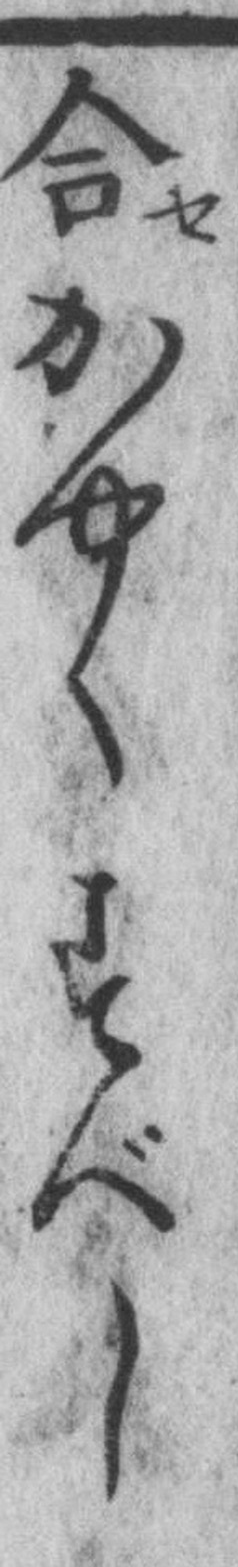合せかやくすべし
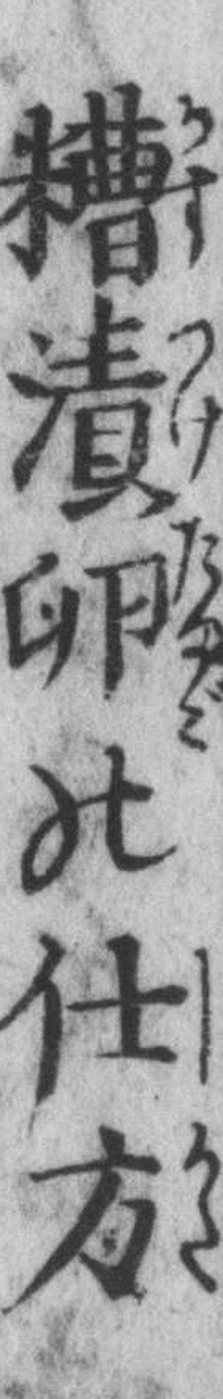糟漬卵の仕方
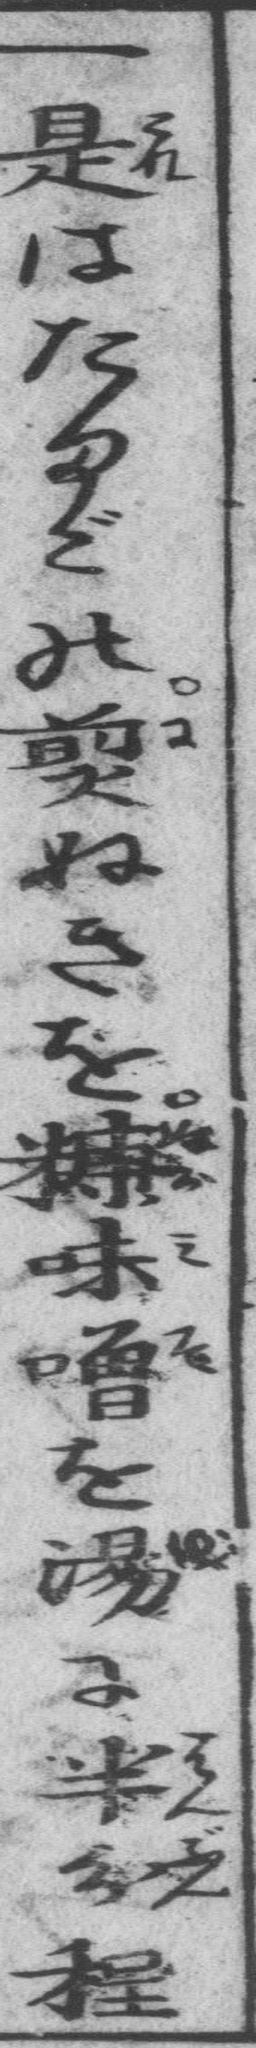一是はたまごの。煎ぬきを。糠味噌を湯に半分程
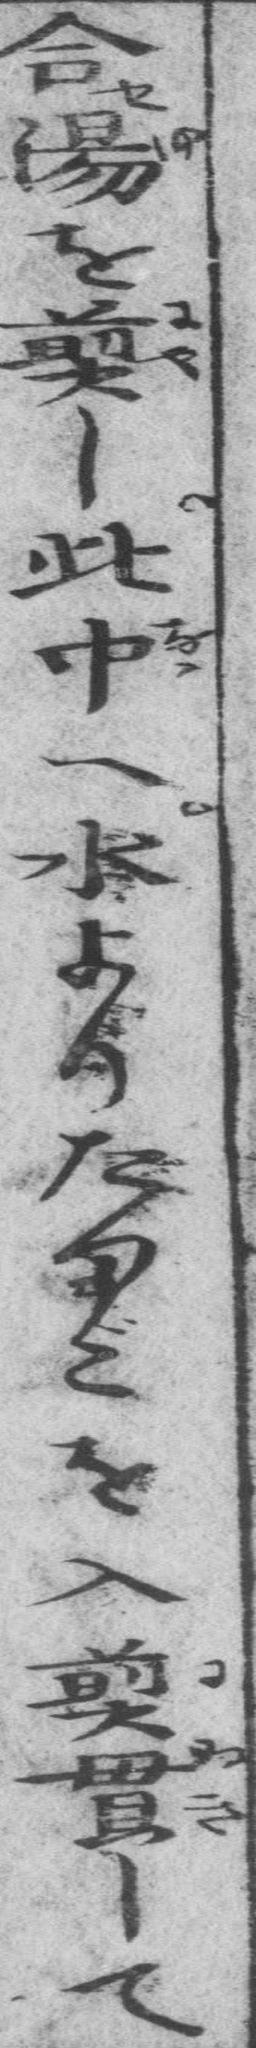合せ湯を煎し。此中へ。水よりたまごを入煎貫して
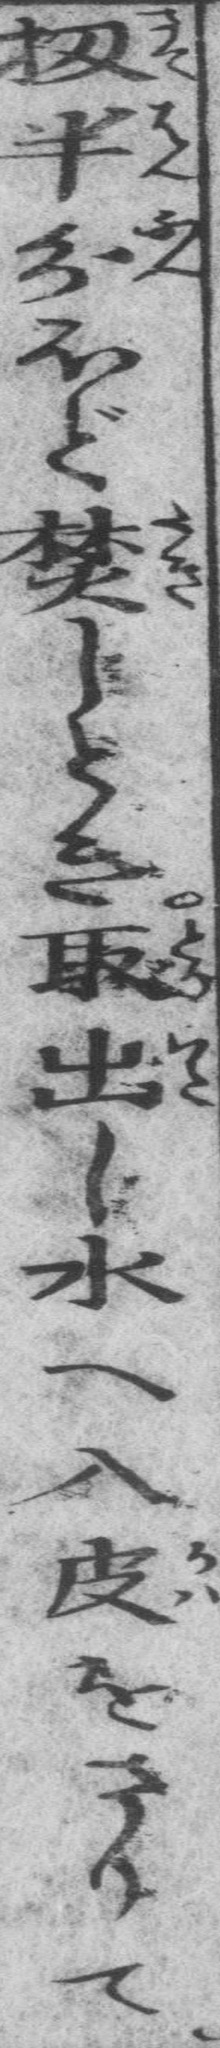扨半分ほど焚しとき。取出し水へ入皮をさりて。
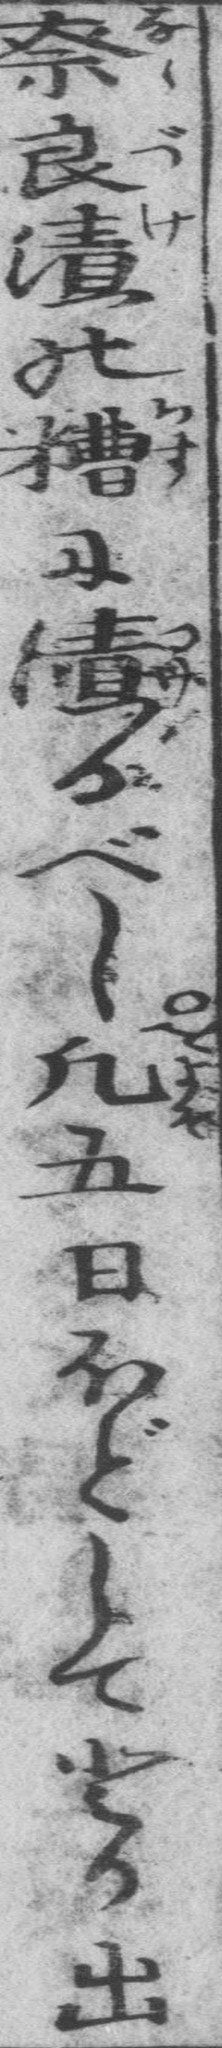奈良漬の糟に漬るべし。凡五日ほどしてとり出
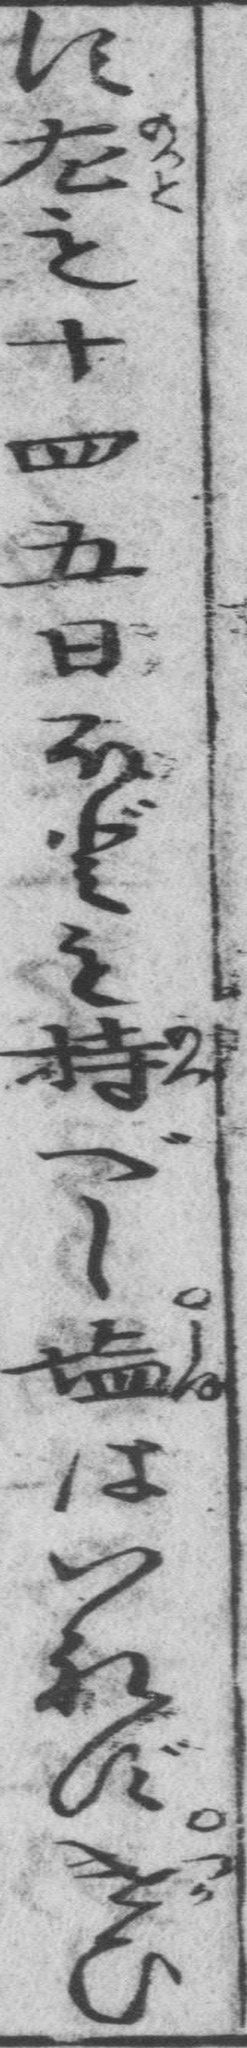す尤も十四五日ほども持べし。塩はいれず。遣ひ
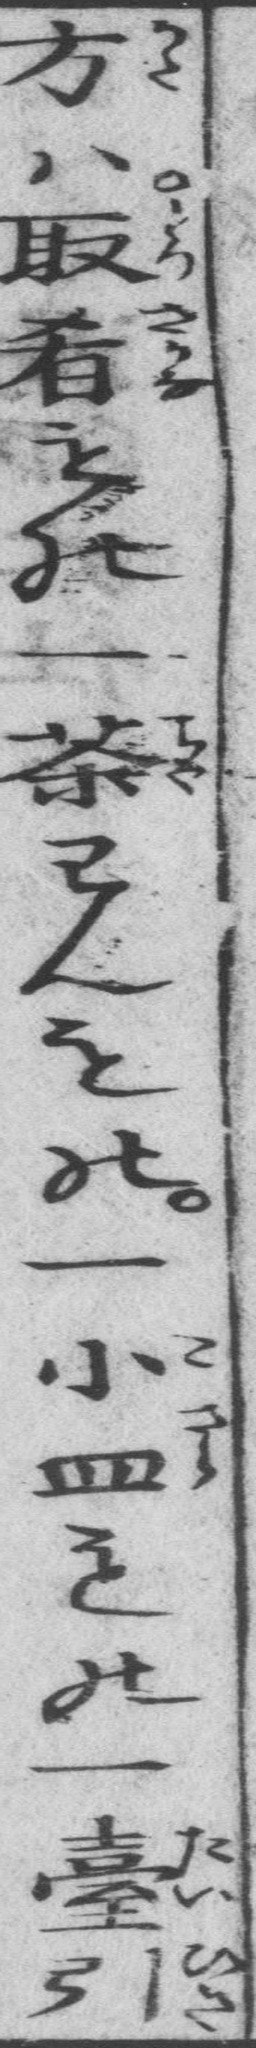方は。取肴もの一茶わんもの。一小皿もの一台引
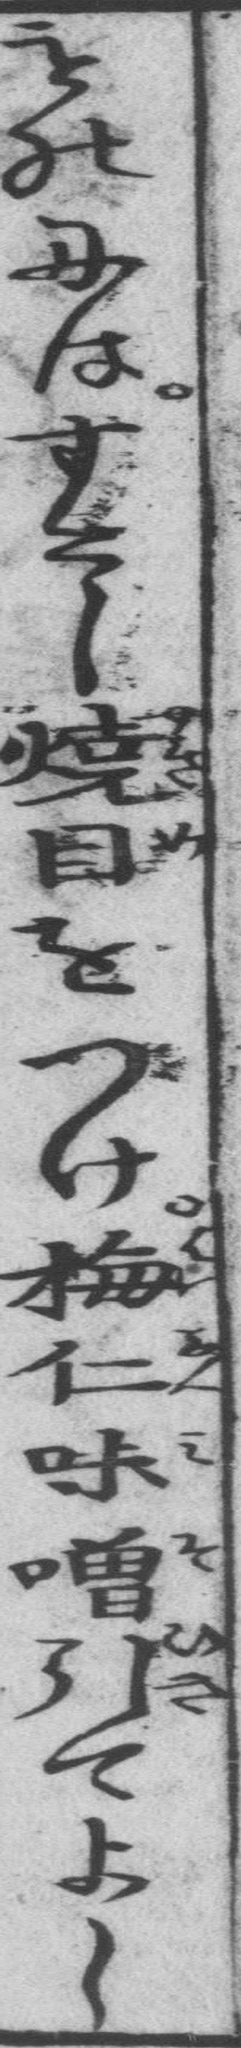ものには。すこし焼目をつけ。梅仁味噌引てよし
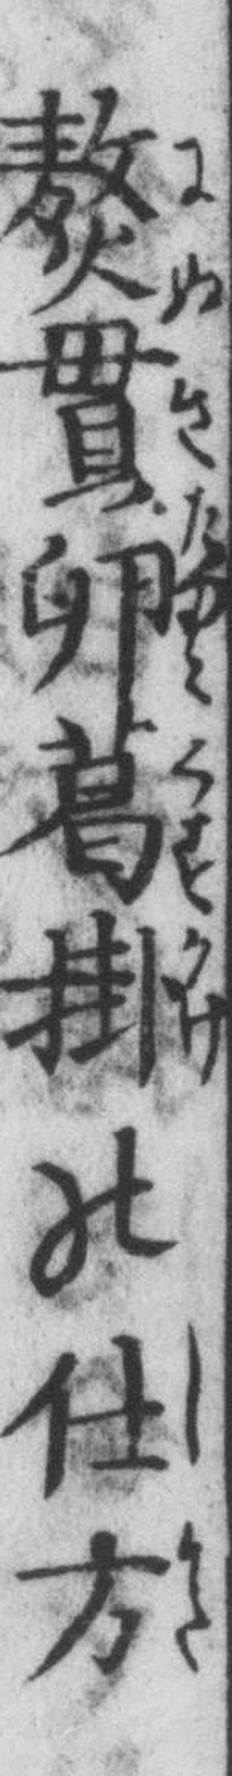熬貫卵葛掛の仕方
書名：萬寳料理秘密箱
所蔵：大阪府立大学学術情報センター 国文学研究資料館
